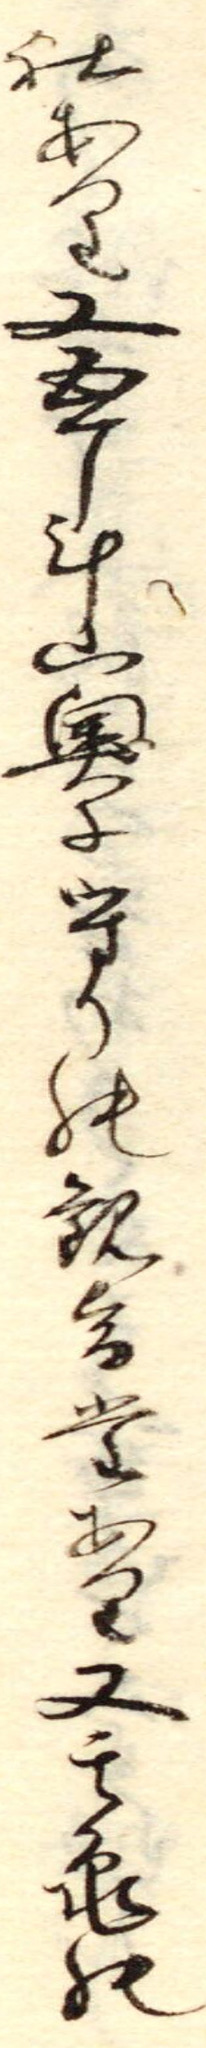社あり又五丁計山奥に守りの観音堂あり又其亀の
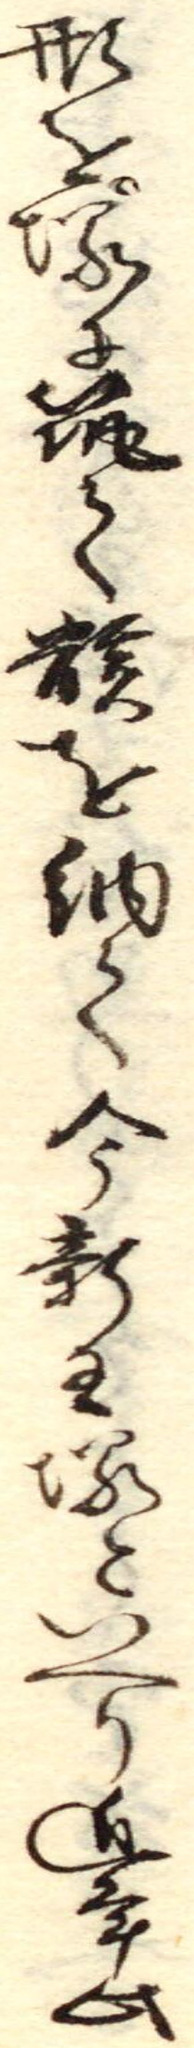形を塚に筑て骸を納て今新王塚といへり近年此
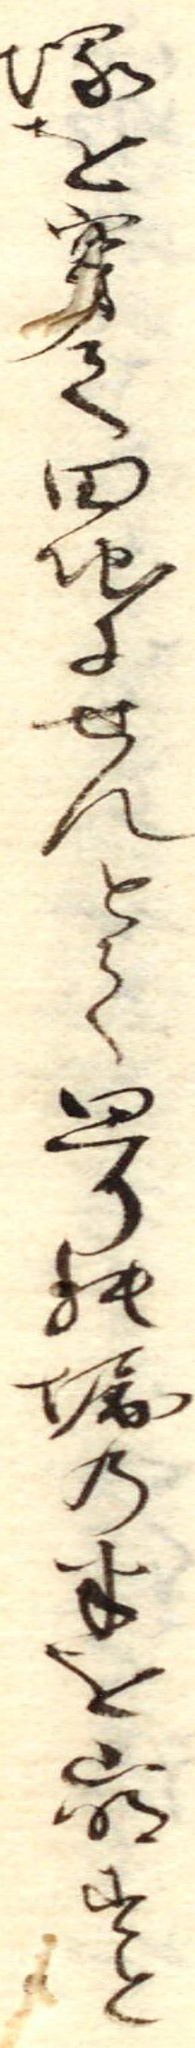塚を穿て田地にせんとて廻りの堀の半を崩すと
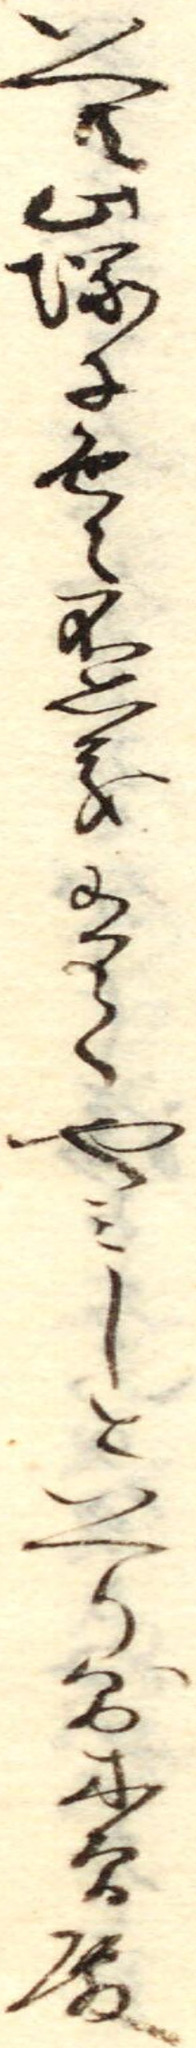いへ共此塚に色々不思義有てやみしといへり則木曽殿
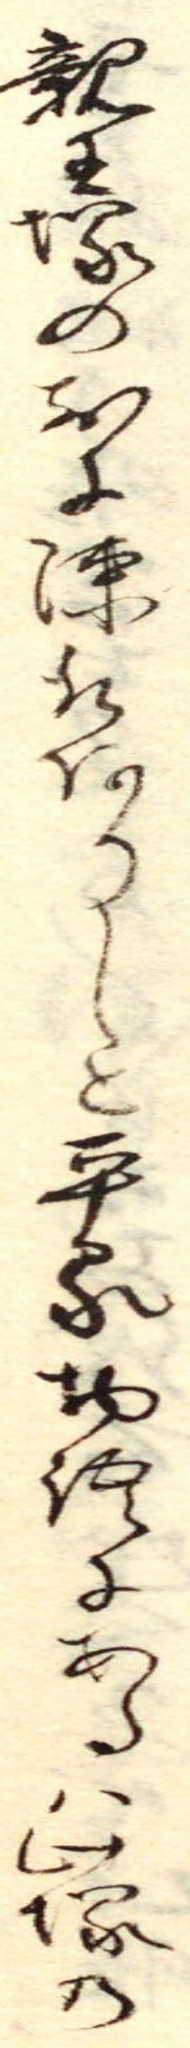親王塚の前に陣取ありしと平家物語にあるは此塚の
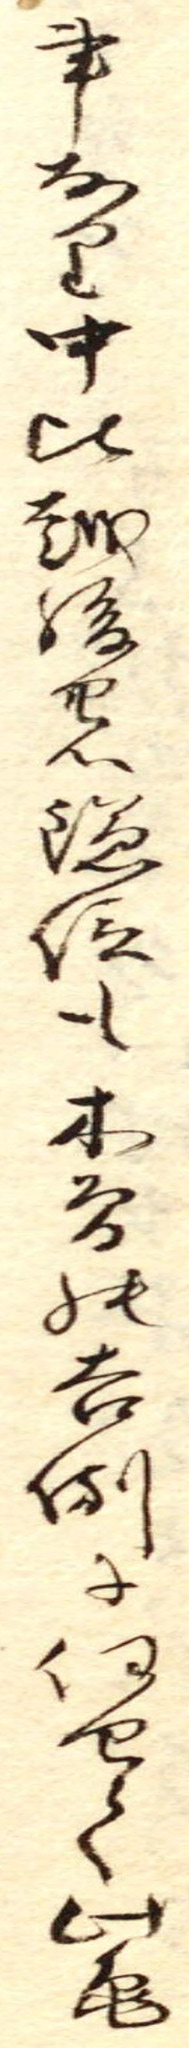事なり中比越後の謙信も木曽の吉例に任せて此亀
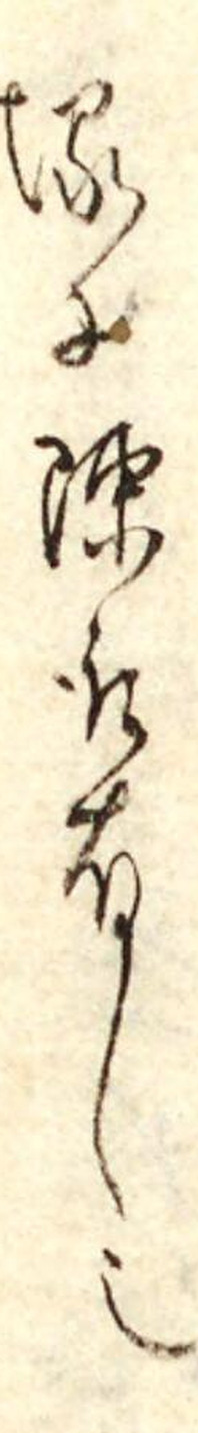塚に陣取有し也
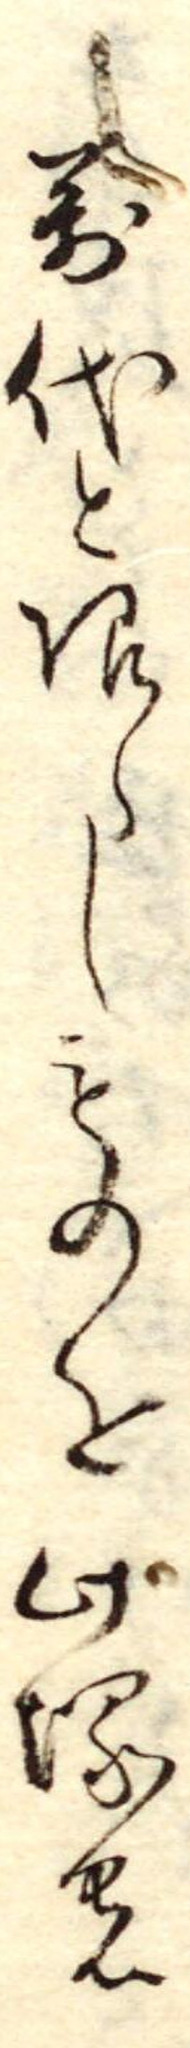万代と限らしものを此塚の
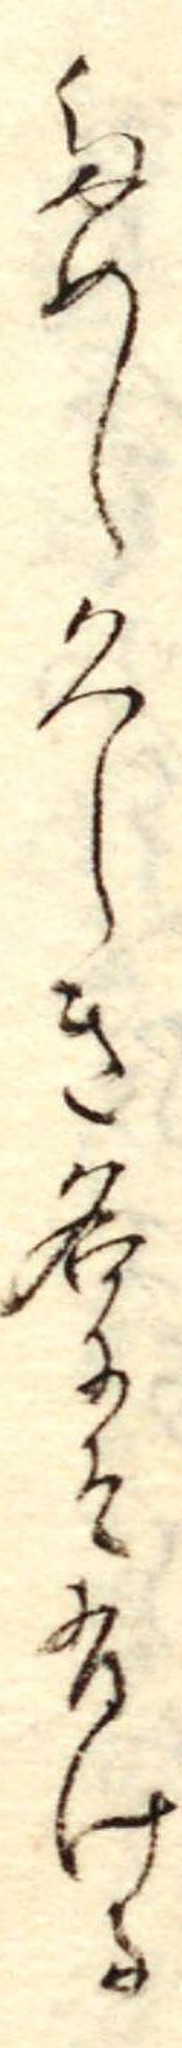ためし久しき名にそ有ける
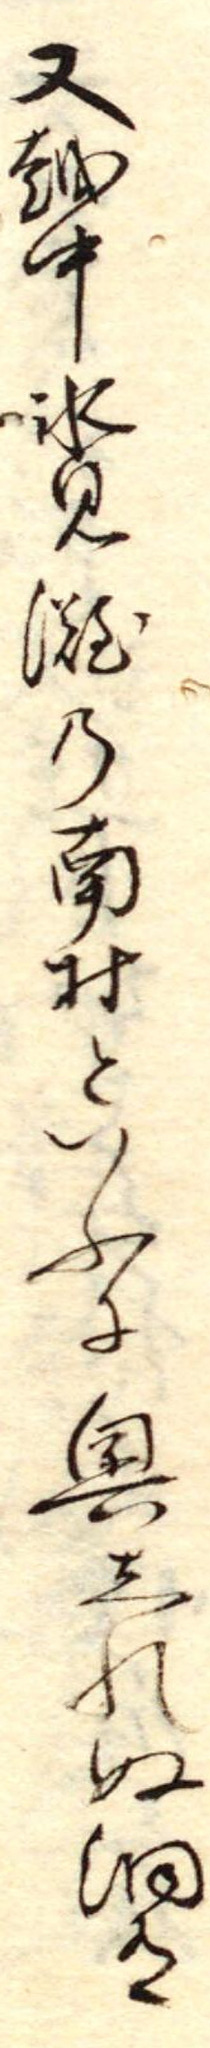又越中氷見灘の南村といふに奥しれぬ洞有
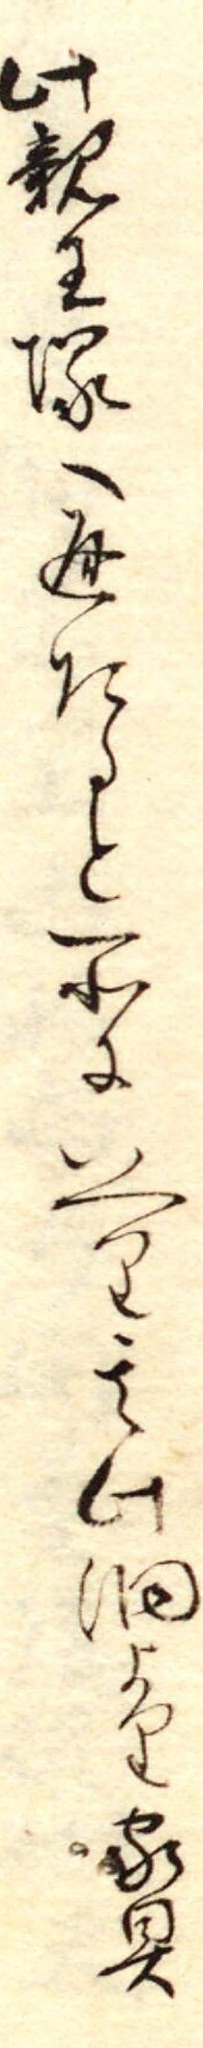此親王塚へ通たると所にいへり其此洞より家具
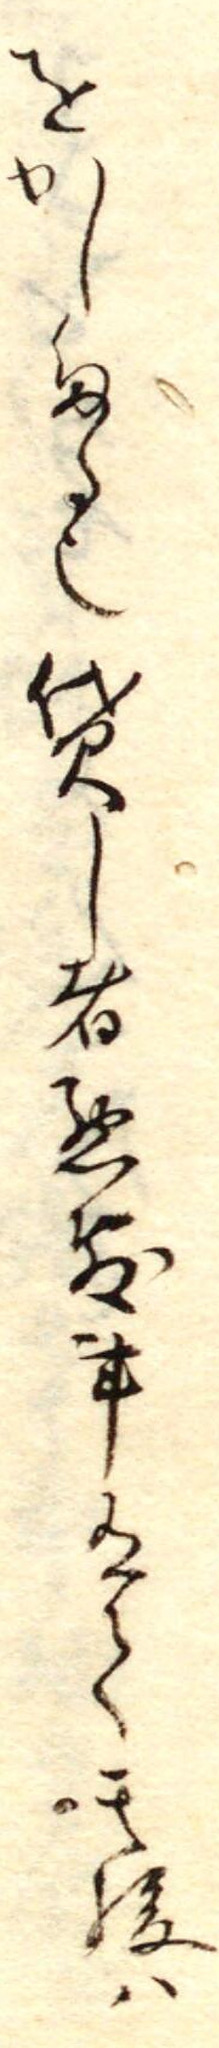をかしたる也貸し者悪敷事有て其後は
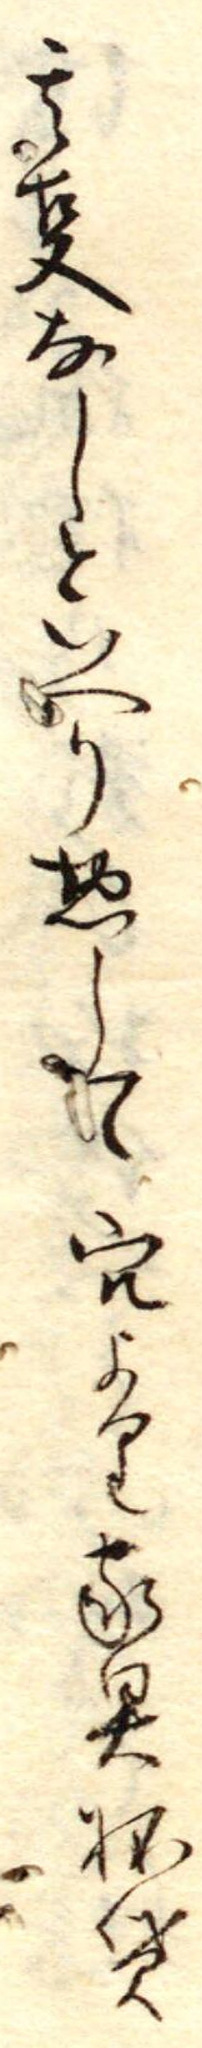其事なしといへり惣して穴より家具抔貸
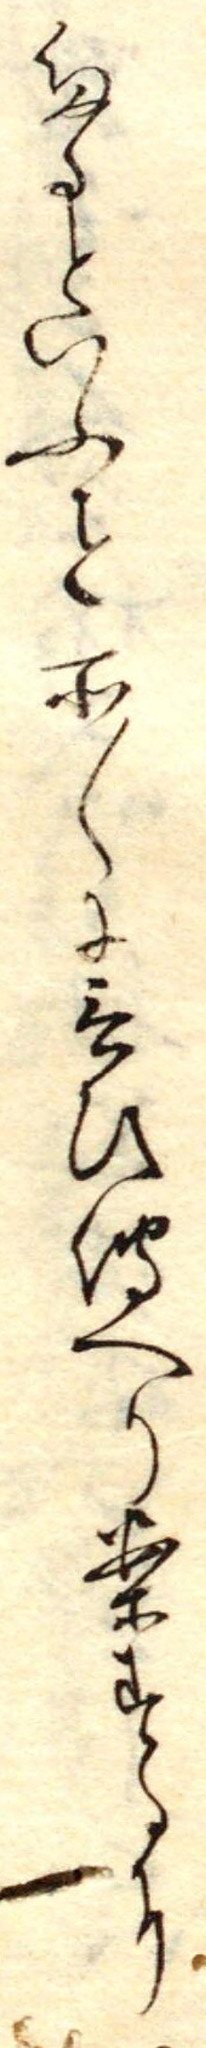たるといふと所〳〵に云ひ伝へり案するに

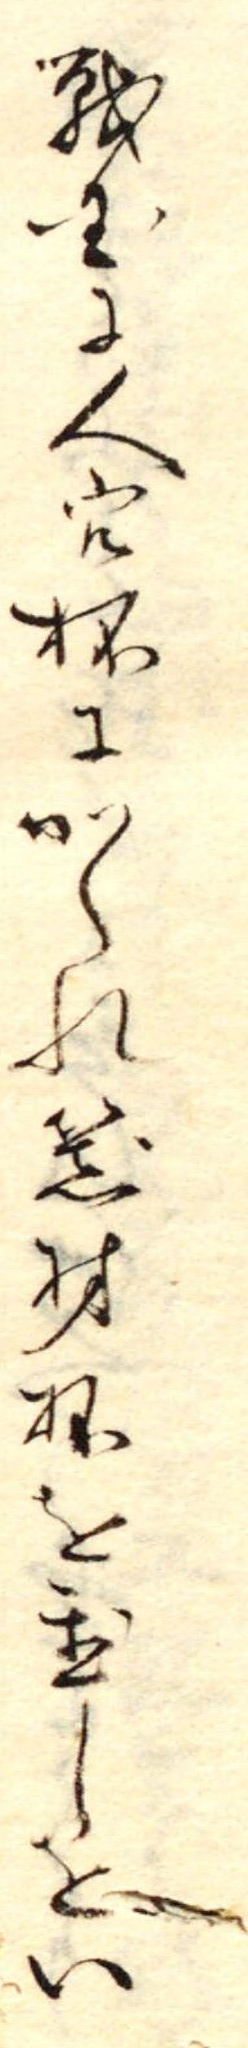戦国に人穴抔にかくれ器材抔を置しをい
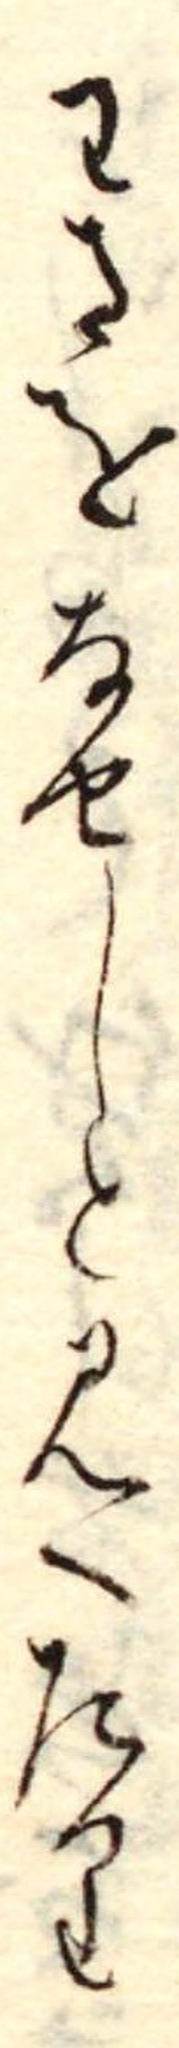わさをなせしと見へたり
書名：能登名跡誌
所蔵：Ishikawa Prefectural Library
